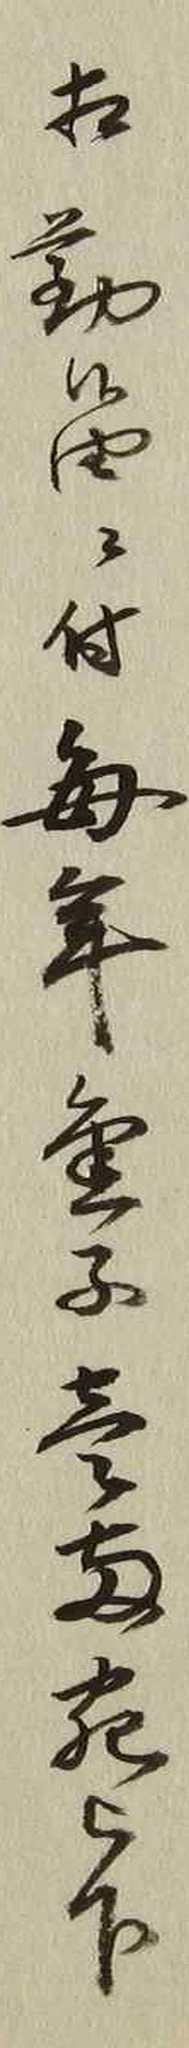相勤候由ニ付毎年金子壱両宛被下
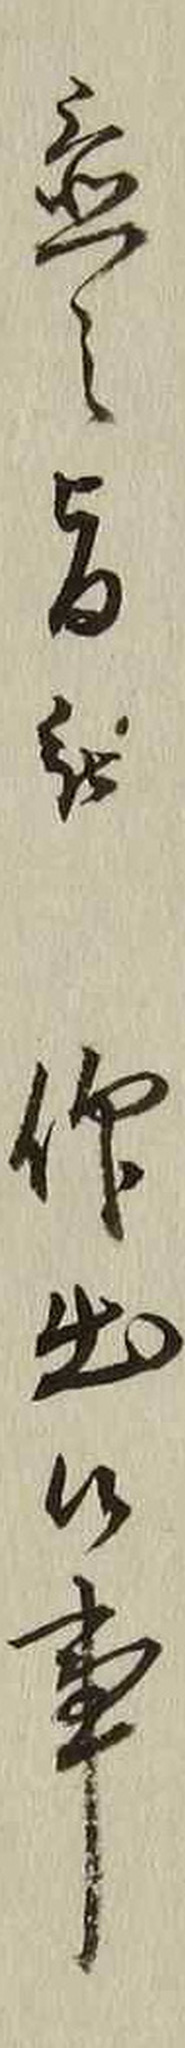置之旨被仰出候事
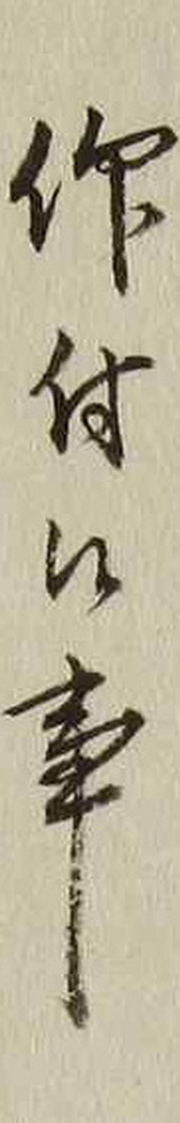仰付候事
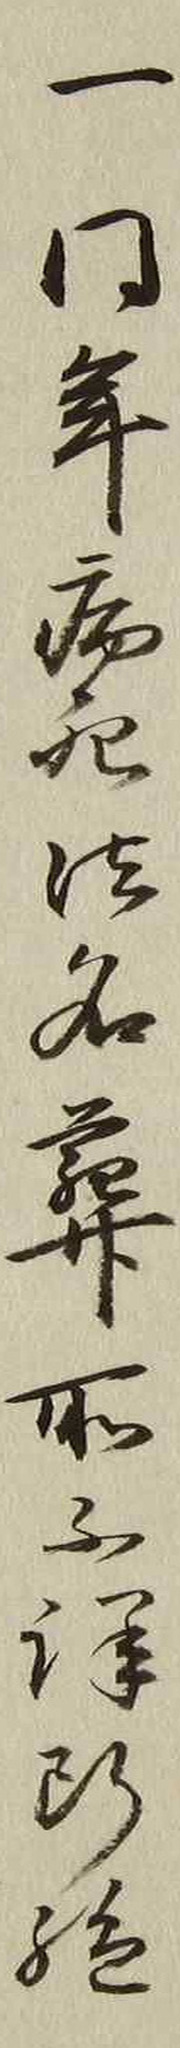一同年病死法名葬所不詳断絶
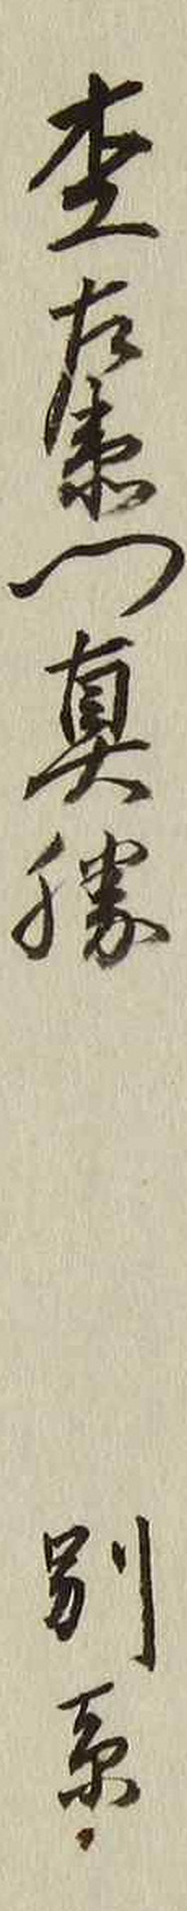杢左衛門真勝別系
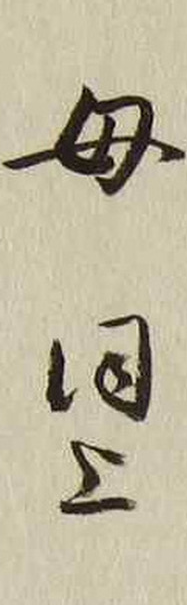母同上
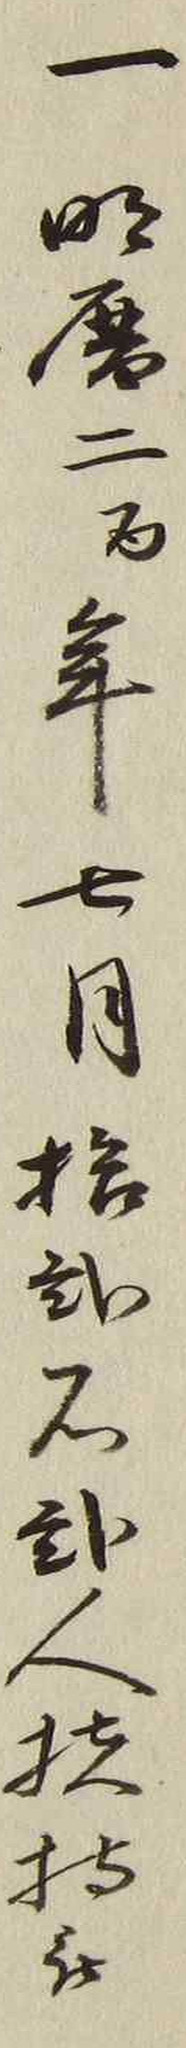一明暦二酉年七月拾弐石弐人扶持被
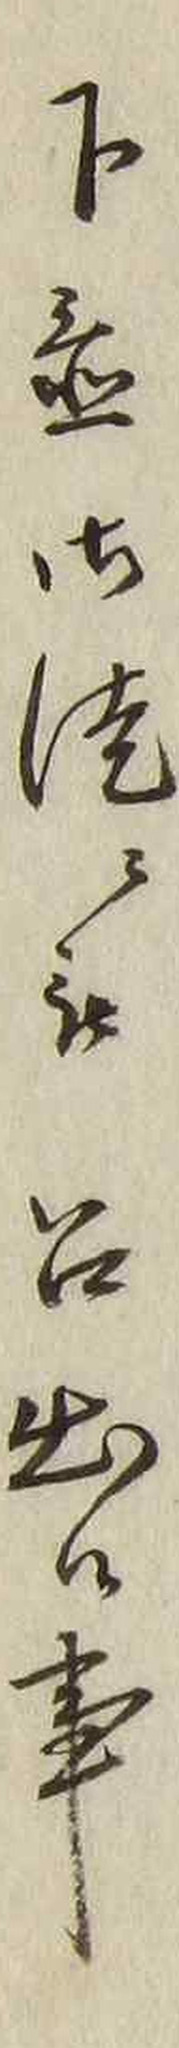下置御徒ニ被召出候事

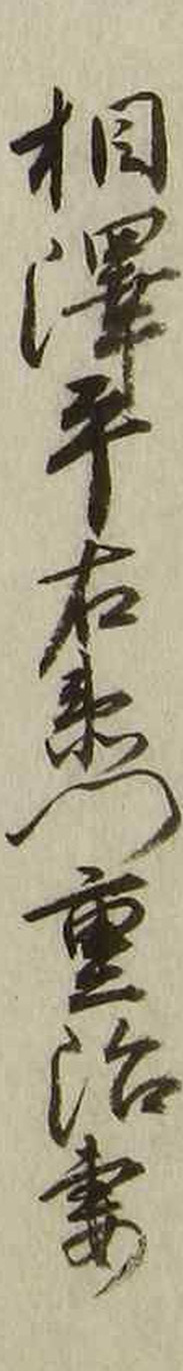女相澤平右衛門重治妻
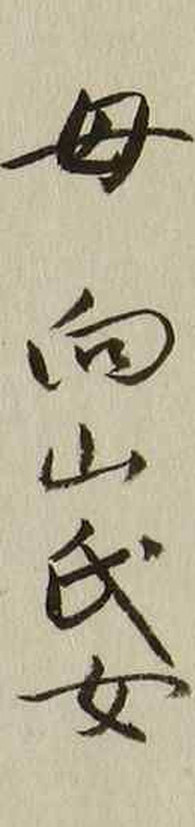母向山氏女
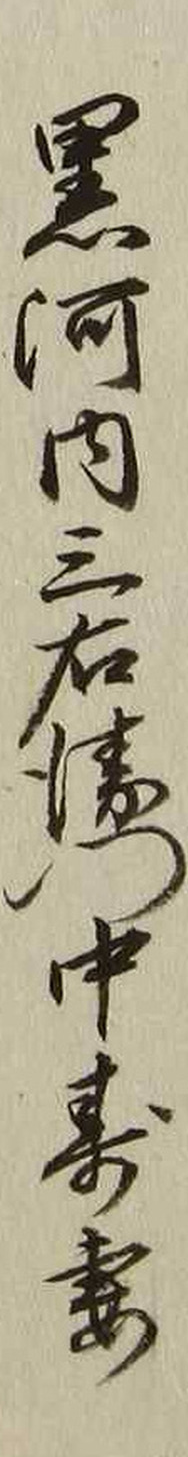女黒河内三右衛門中寿妻
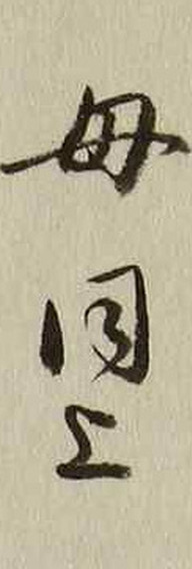母同上
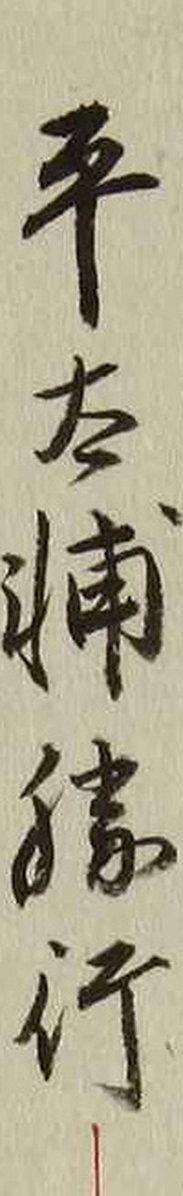平太輔勝行
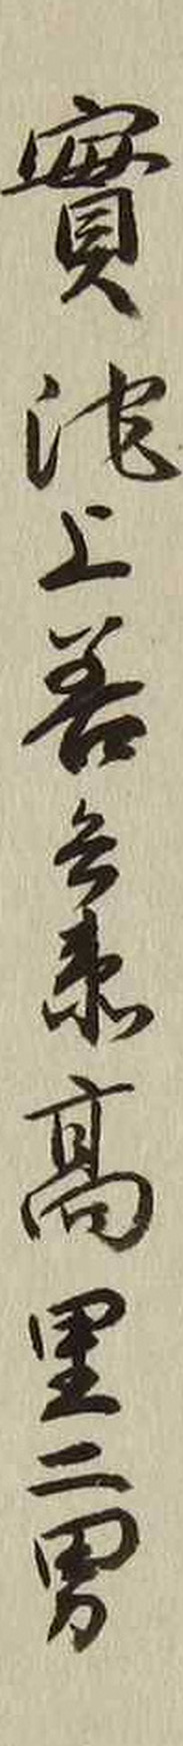実池上善兵衛高里二男
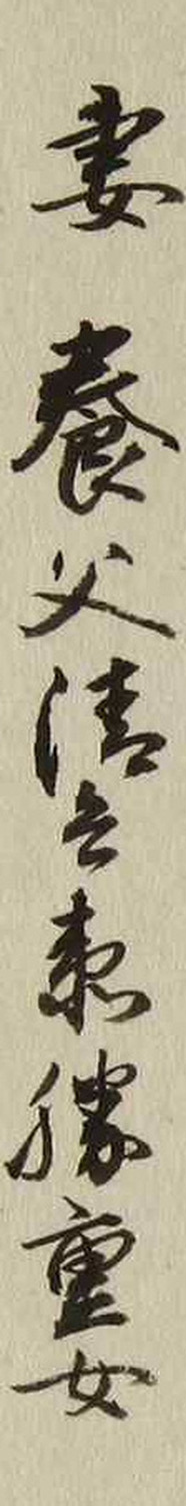妻養父清兵衛勝重女
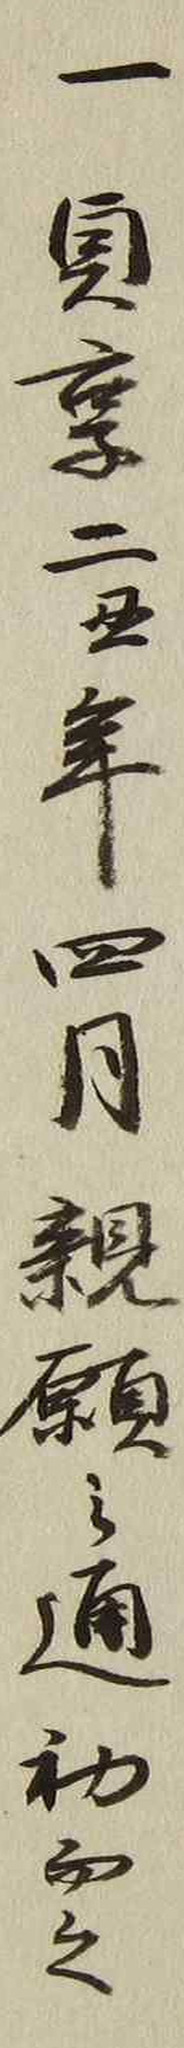一貞享二丑年四月親願之通初而之
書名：諸士系譜　巻之128　た之部4
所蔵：会津若松市立会津図書館
